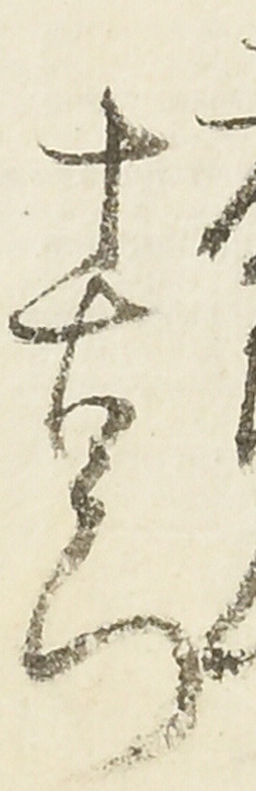十右衛門

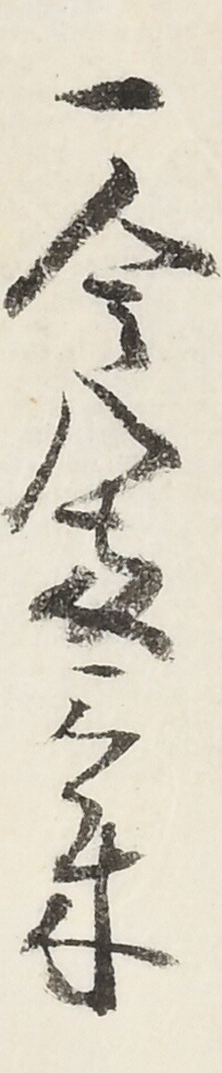一金八両三朱赤羽村
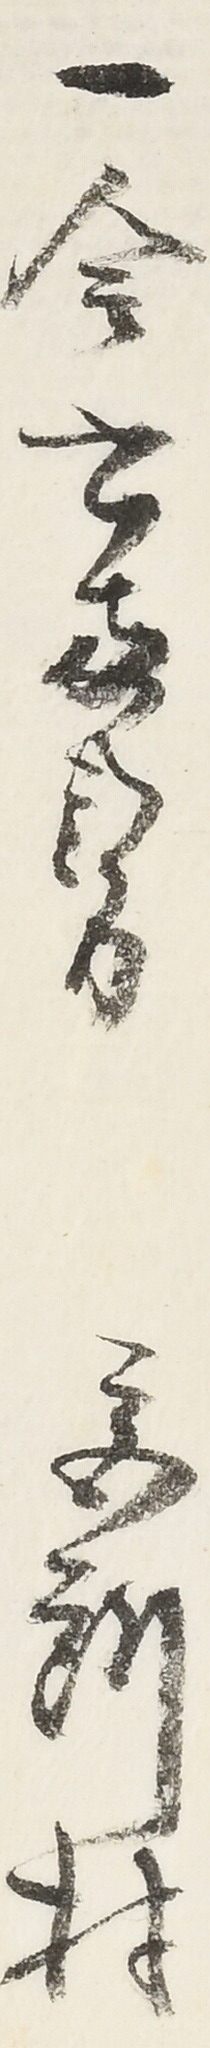一金六両弐分宮所村
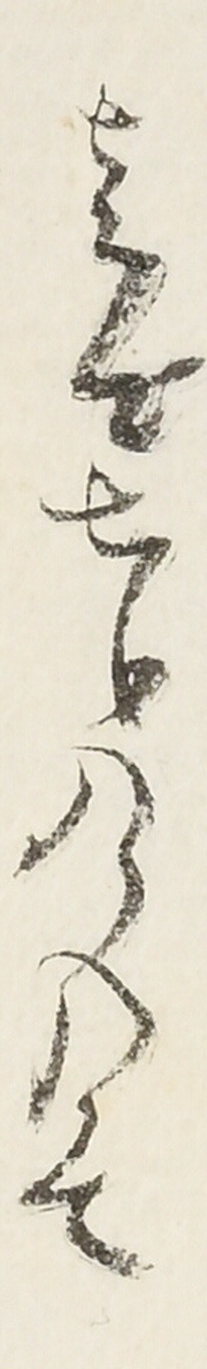壱匁七分八厘八毛
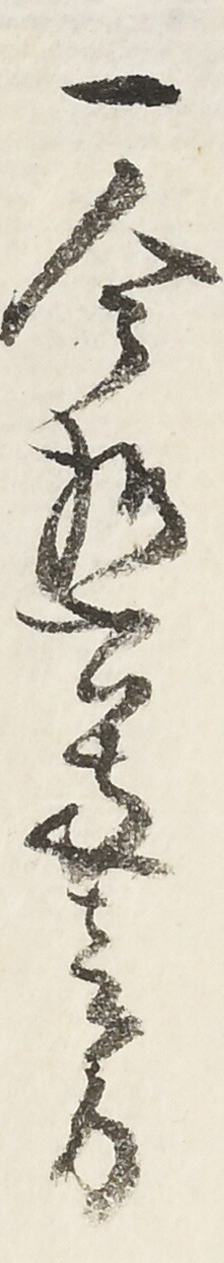一金八両壱分
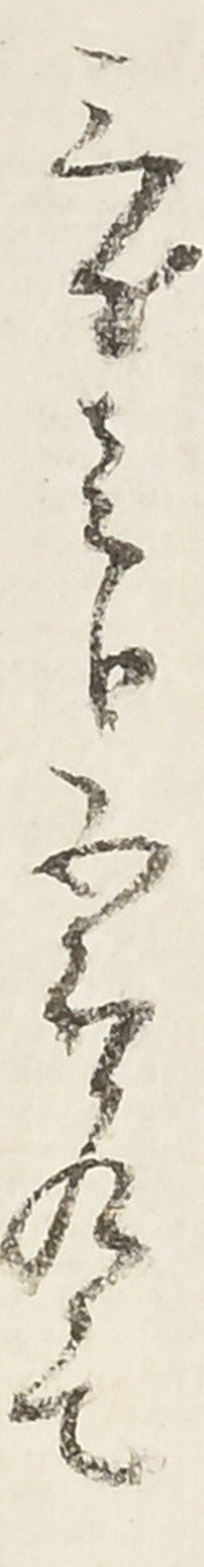三匁壱分五厘九毛
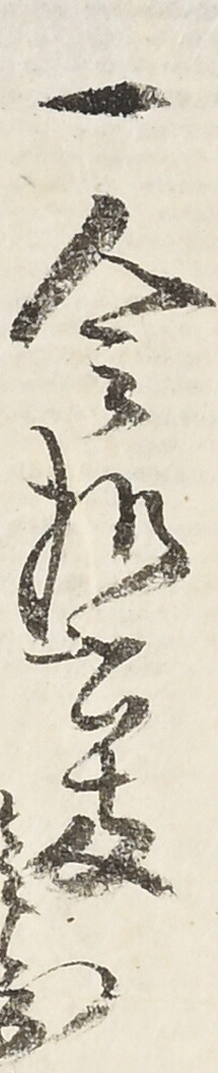一金八両壱分
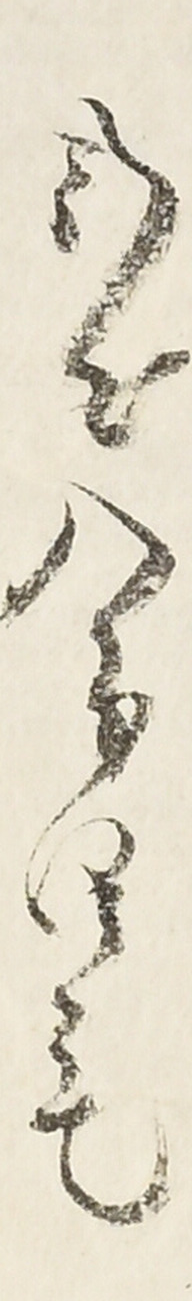弐匁八分四毛
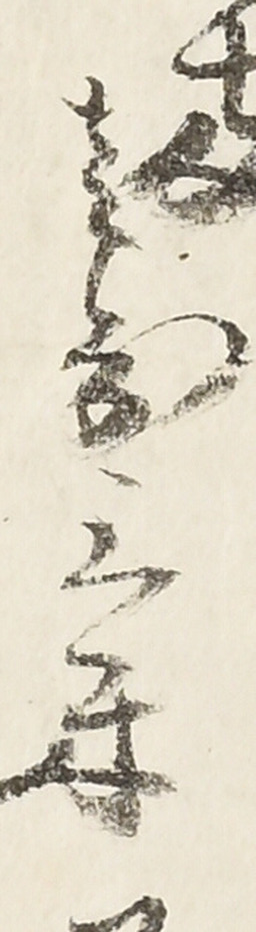壱分三朱
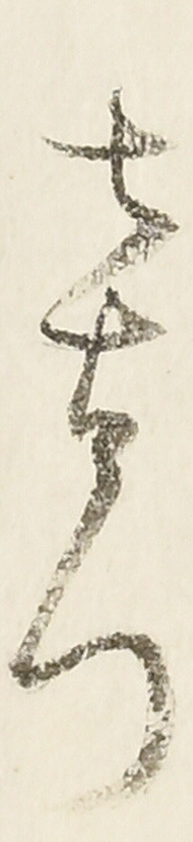七右衛門
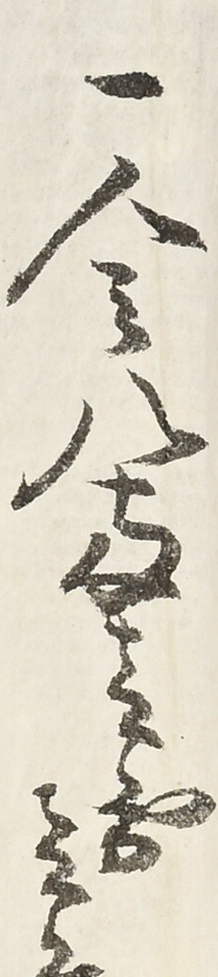一金八両壱分
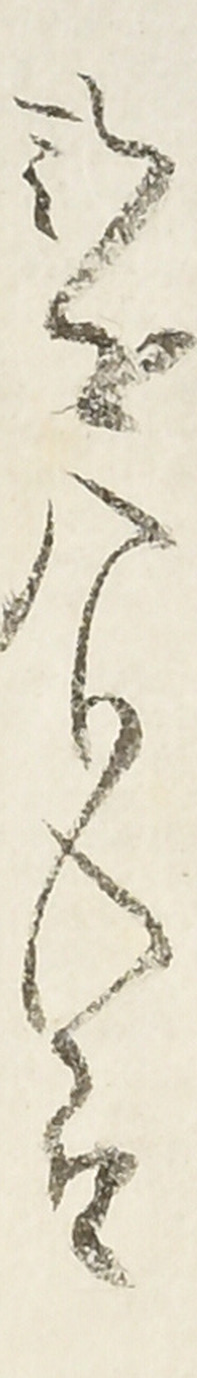弐匁八分八厘
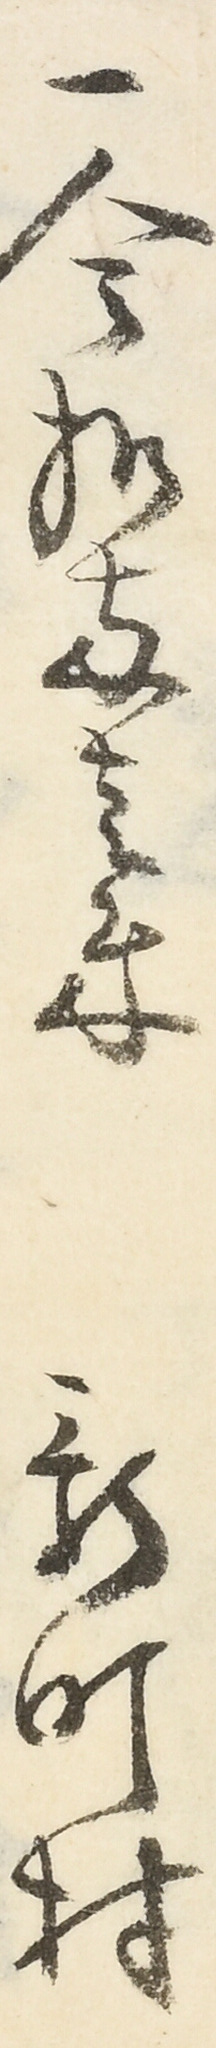一金拾両壱朱新町村
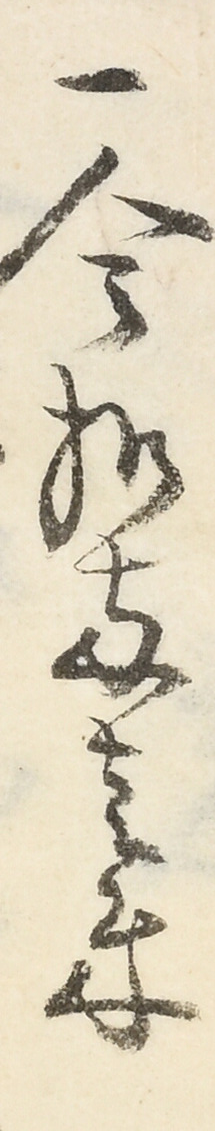一金八両壱分
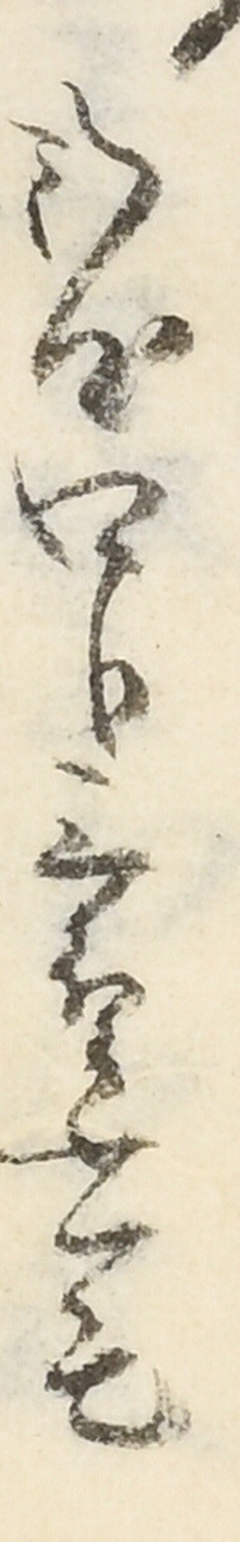弐匁四分三厘六毛

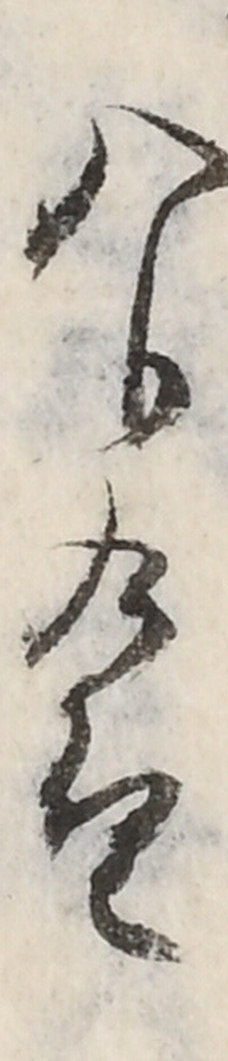八分九厘
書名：在町帯刀献金割帳
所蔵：伊那市立高遠町図書館・合同会社AMANE
